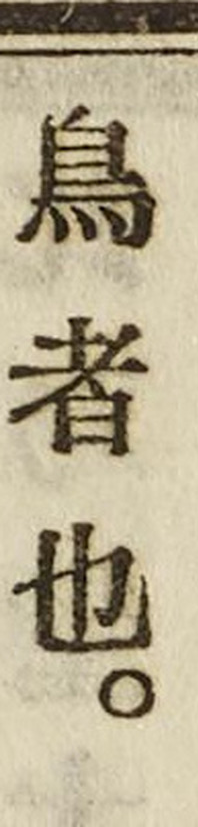鳥者也。
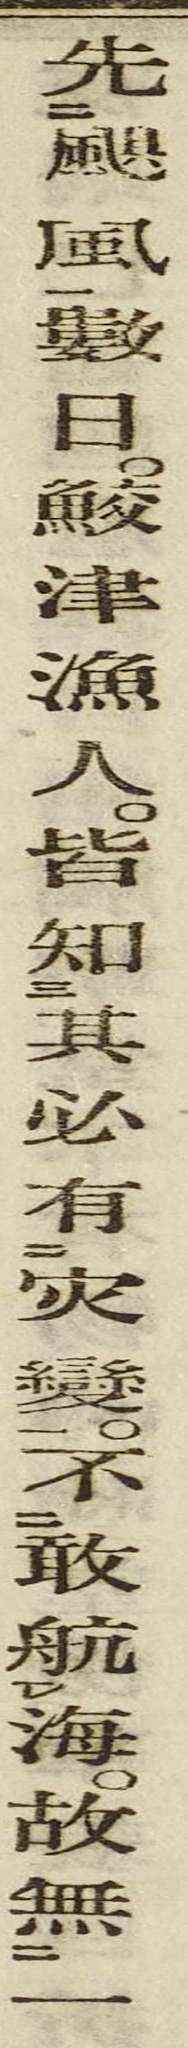先ニ颱風数日。鮫津漁人。皆知其必有ニ灾変。不ニ敢航レ海。故無ニ一
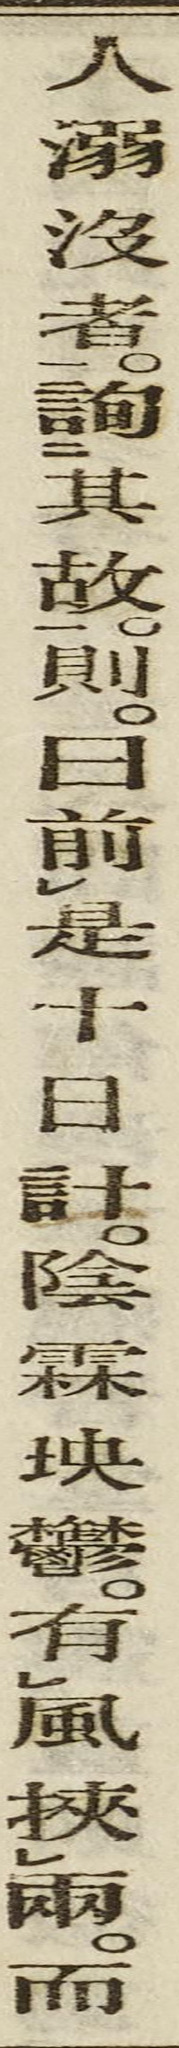人溺没者。詢ニ其故。則。曰前是十日計。陰霖坱鬱。有風挟両。而
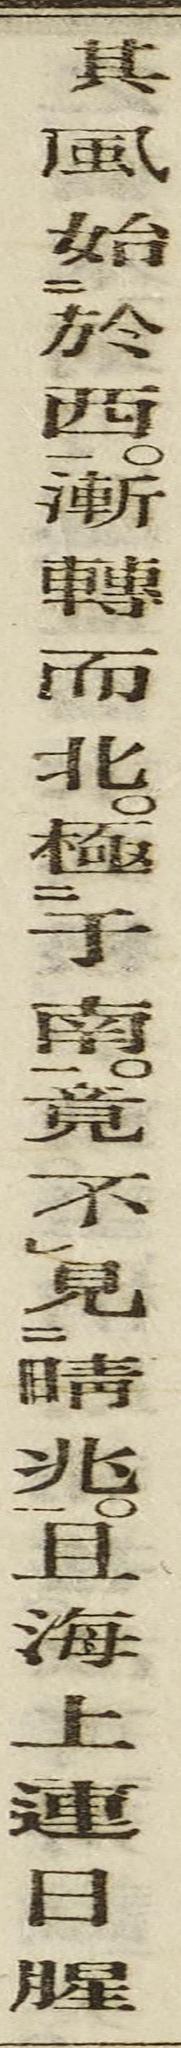其風始ニ於西。漸転而北。極ニ于南。竟不見ニ晴兆。且海上連日腥
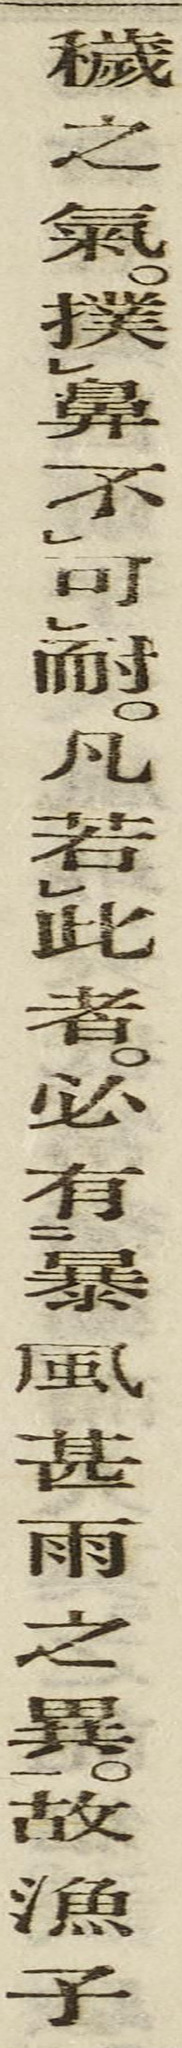穢之気。撲鼻不可耐。凡若此者。有ニ暴風甚雨之異。故漁子
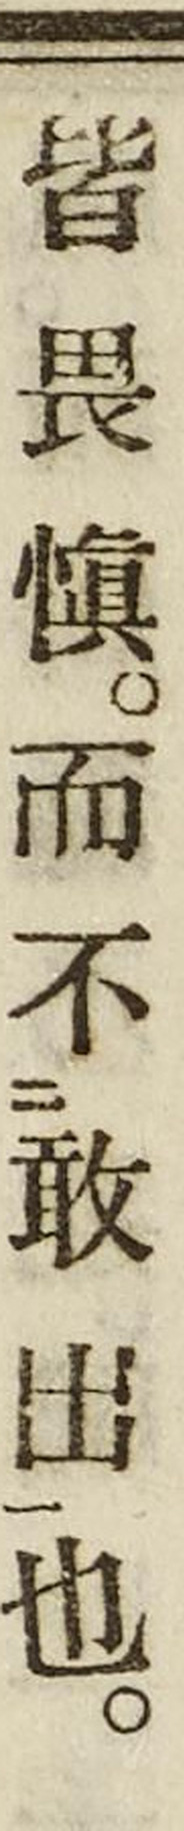皆畏慎。而不ニ敢出也。
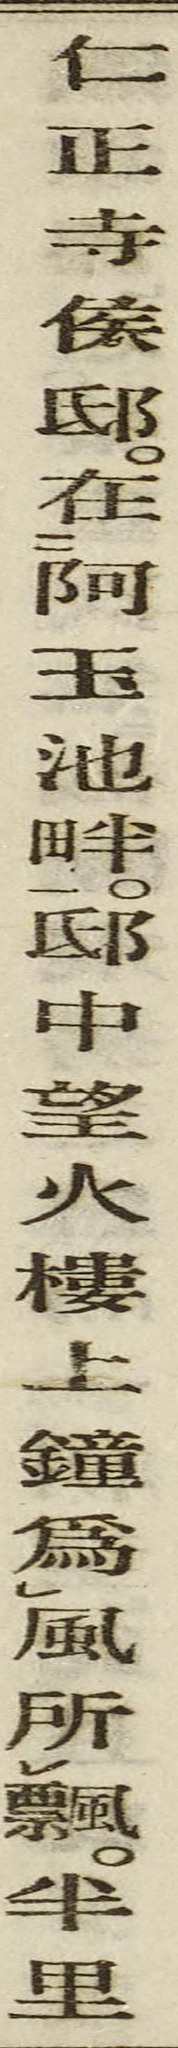仁正寺侯邸。在ニ阿玉池畔。邸中望火楼上鐘為風所飄。半里
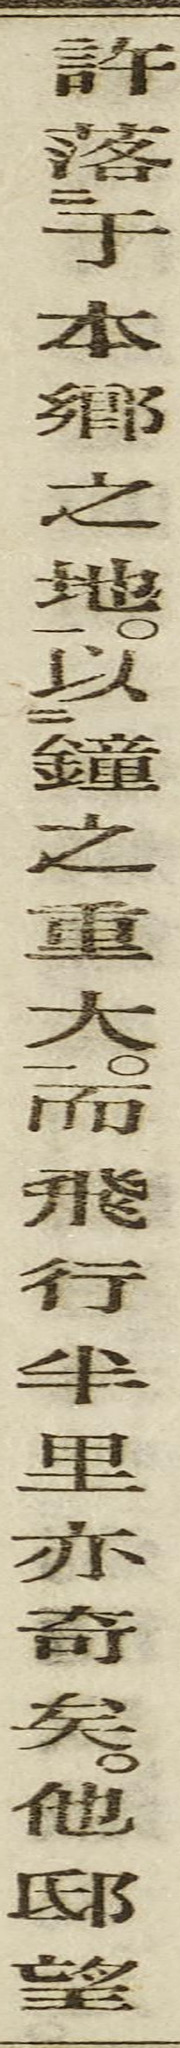許落ニ于本郷之地。以ニ鐘之重大。而飛行半里亦奇矣。他邸望
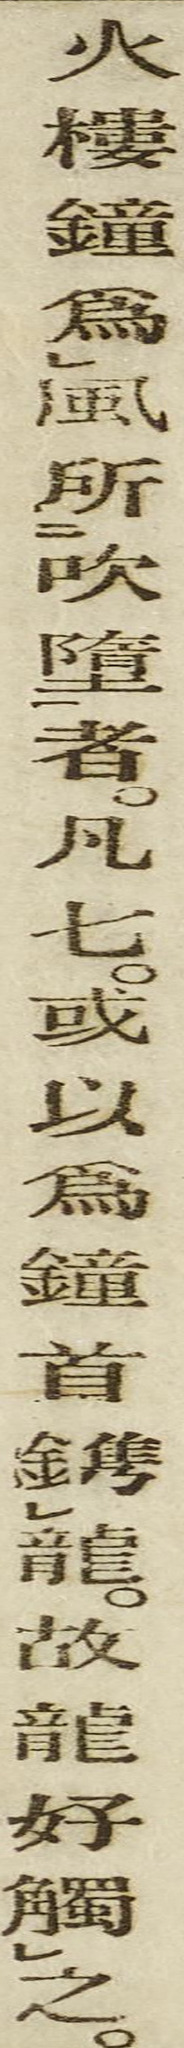火楼鐘為風所ニ吹堕者。凡七。或以為鐘首鐫龍。故龍好触之。

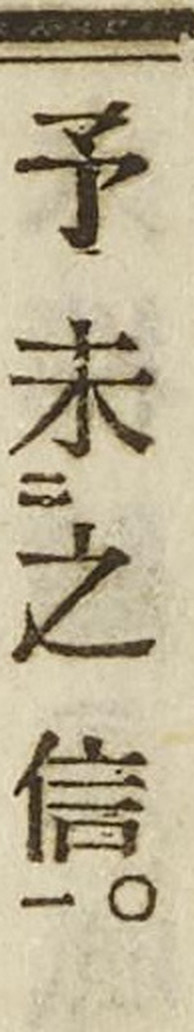予未ニ之信。
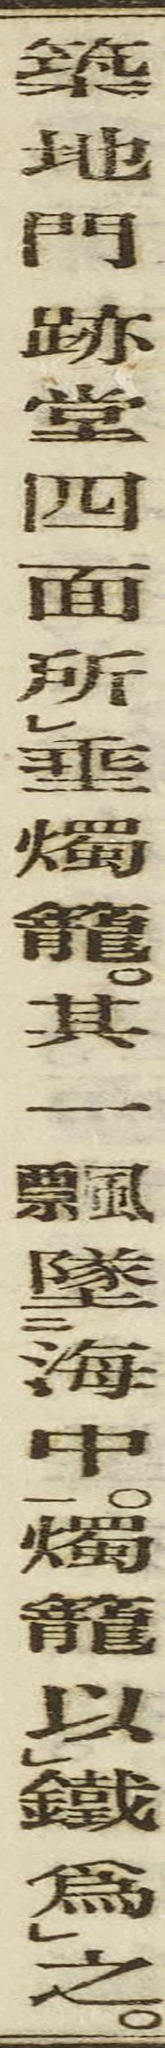築地門跡堂四面所垂燭籠。其一飄墜ニ海中。燭籠以鉄為之。
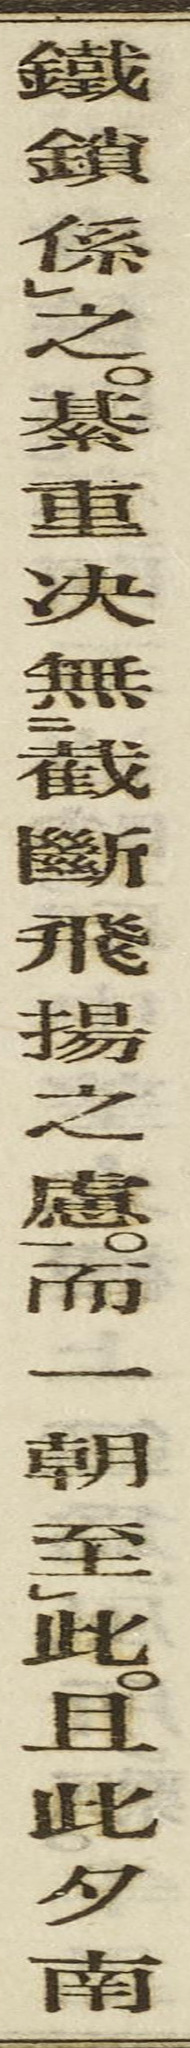鉄鎖係之。綦重決無ニ截断飛揚之慮。而一朝至此。且此夕南
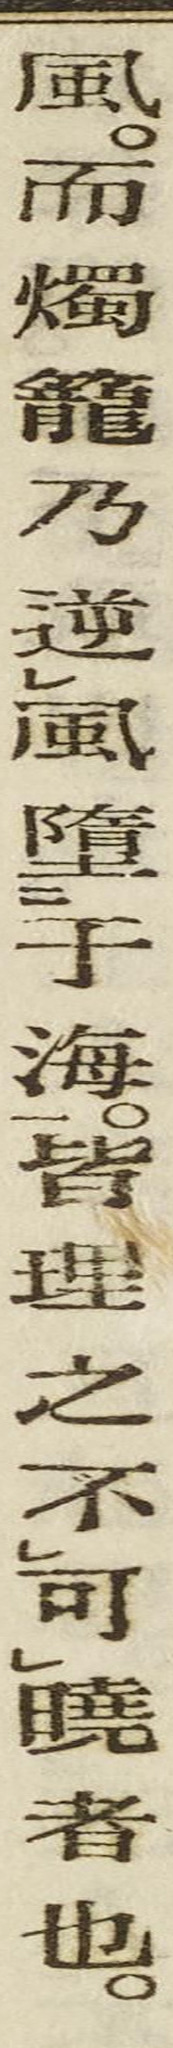風。而燭籠乃逆風堕ニ于海。皆理之不可暁者也。
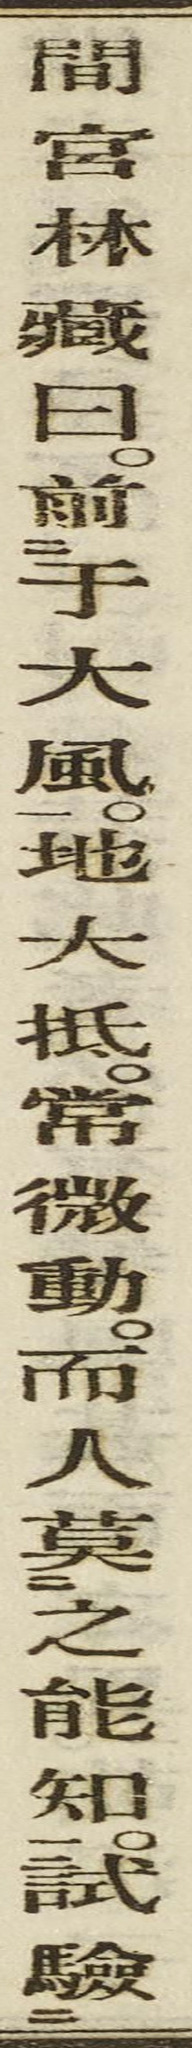間宮林蔵曰。前ニ于大風。地大抵。常微動。而人莫ニ之能知。試験ニ
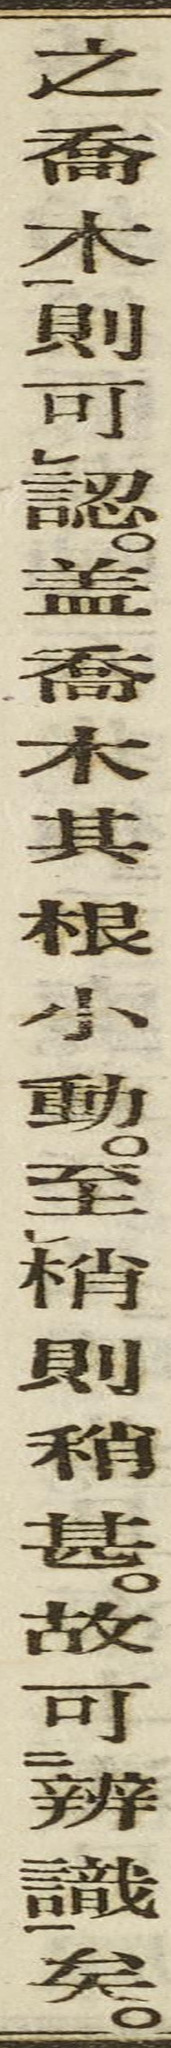之喬木則可認。盖喬木其根小動。至梢則稍甚。故可ニ弁識矣。
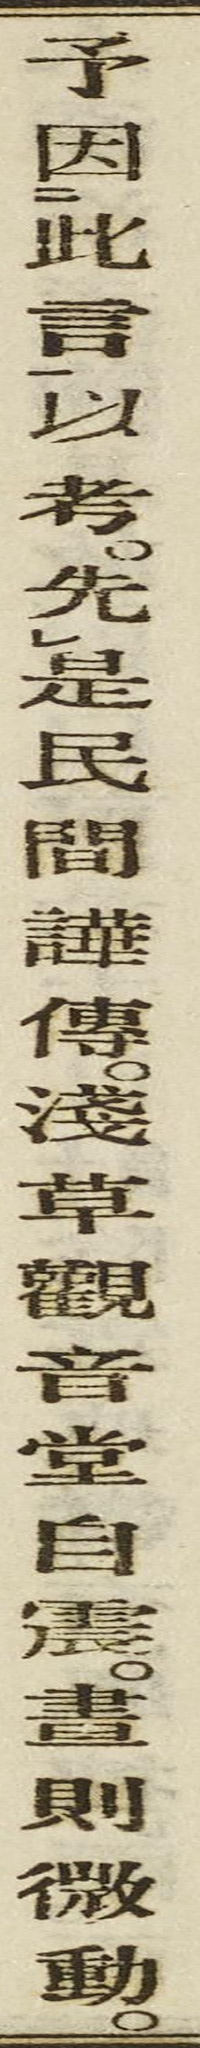予因ニ此言以考。先是民間譁伝。浅草観音堂自震。昼則微動。
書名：史籍集覽　朝鮮陣古文・細井廣澤記・颶風紀事・天明七年將軍宣下次第書　全
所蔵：東京大学地震研究所図書室 Earthquake Research Institute Library, The University of Tokyo, JAPAN
